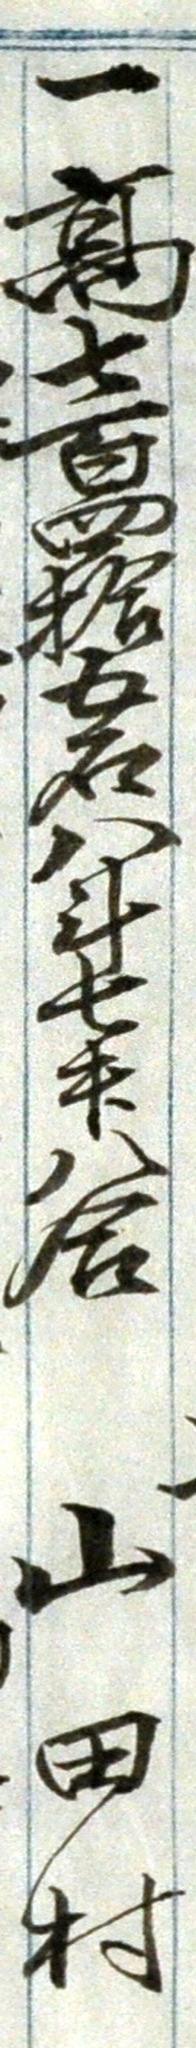一高七百四拾五石八斗七升八合山田村
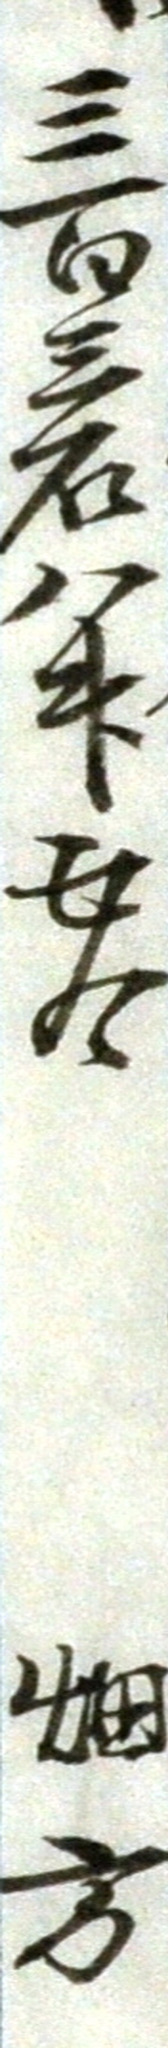三百三石八升五合畑方
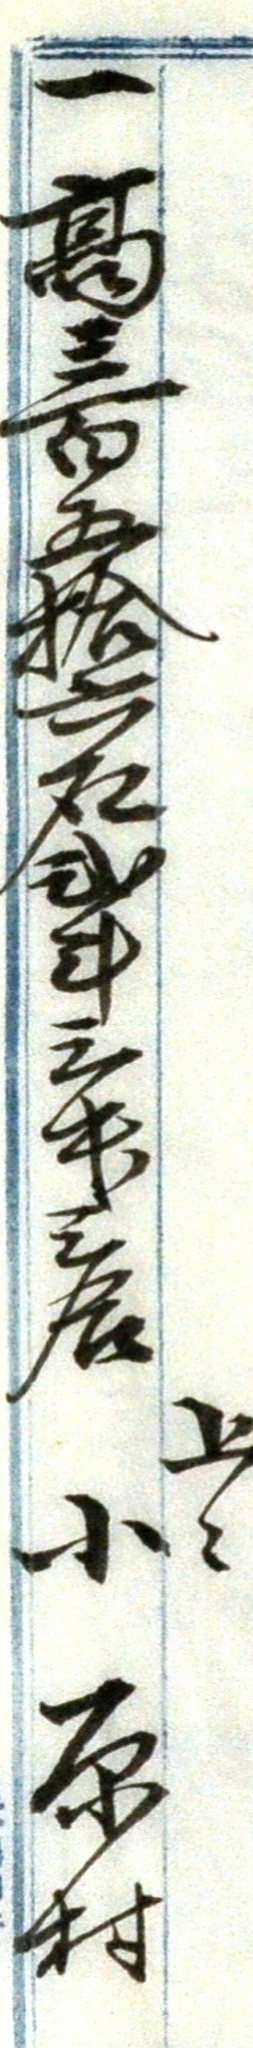一高三百五拾六石弐斗三升三合小原村
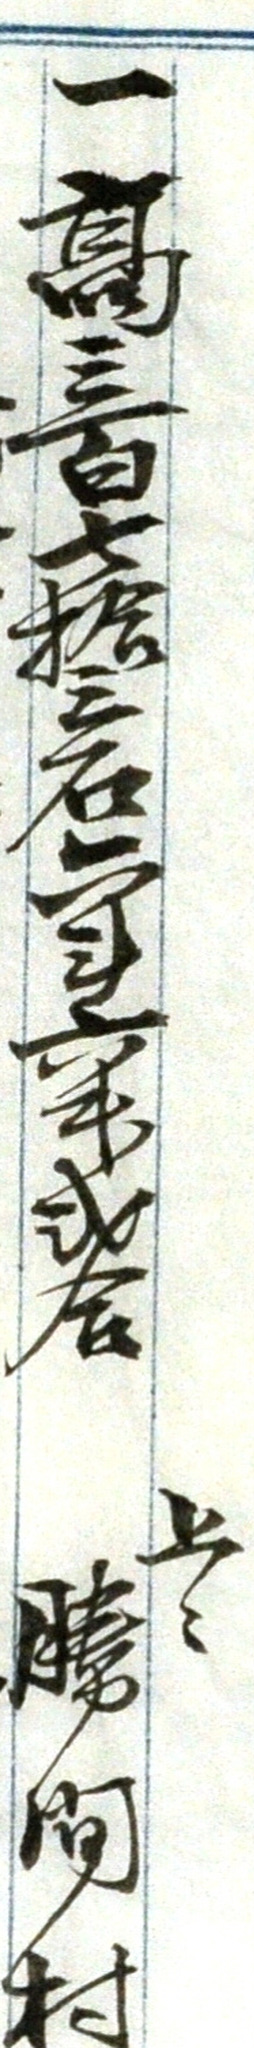一高三百七拾三石六斗六升弐合勝間村
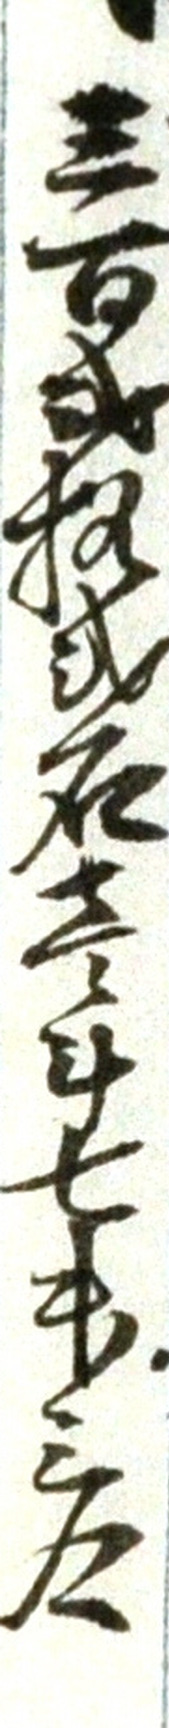三百弐拾弐石壱斗七升三合畑方
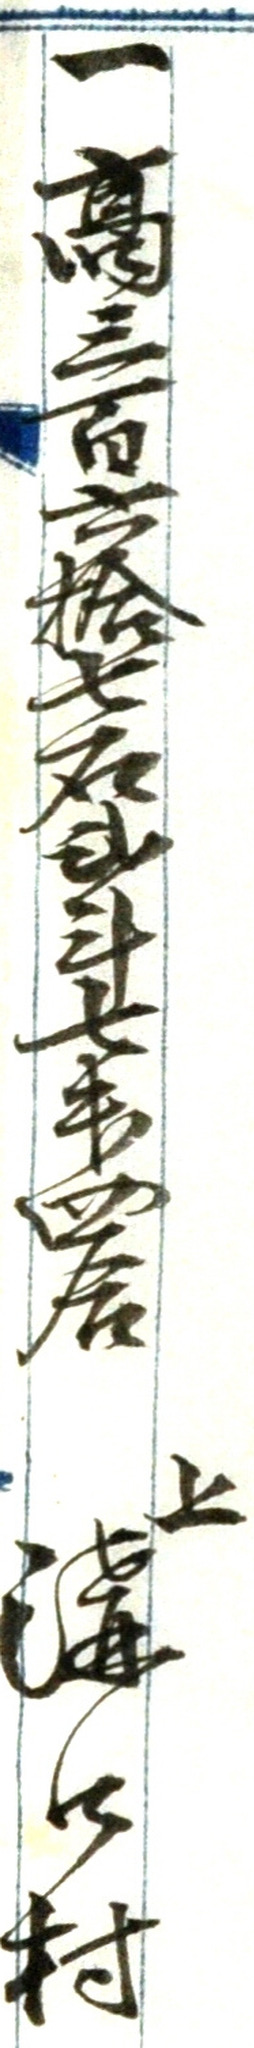一高三百六拾七石弐斗七升四合溝口村

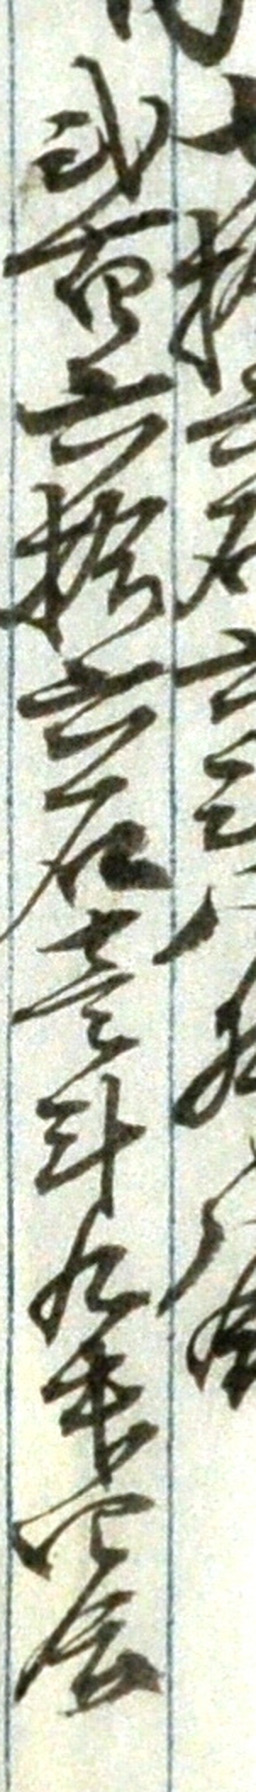弐百六拾六石壱斗九升四合畑方
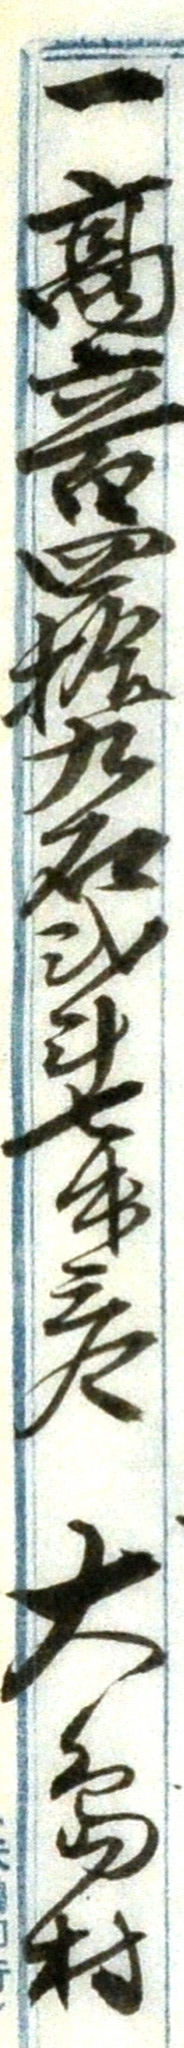一高六百四拾九石弐斗七升三合大島村
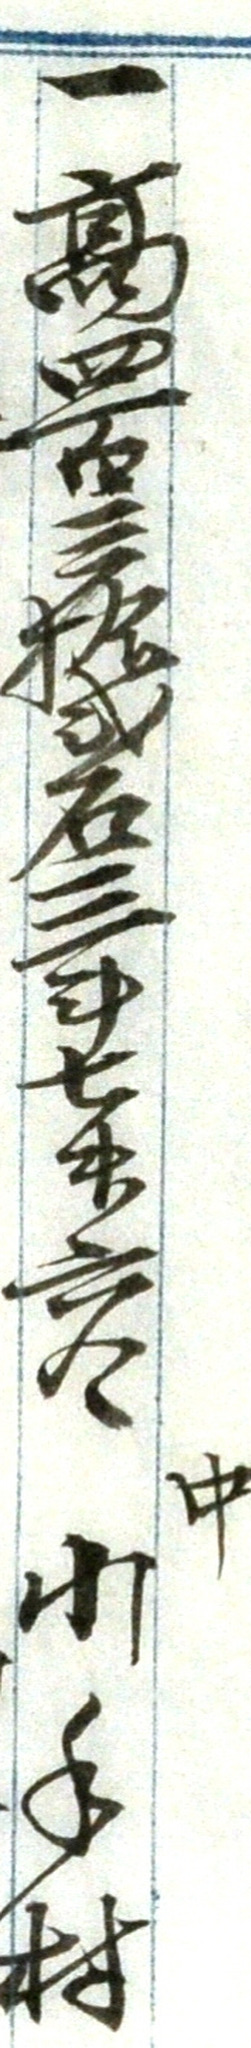一高四百三拾弐石三斗七升六合川手村
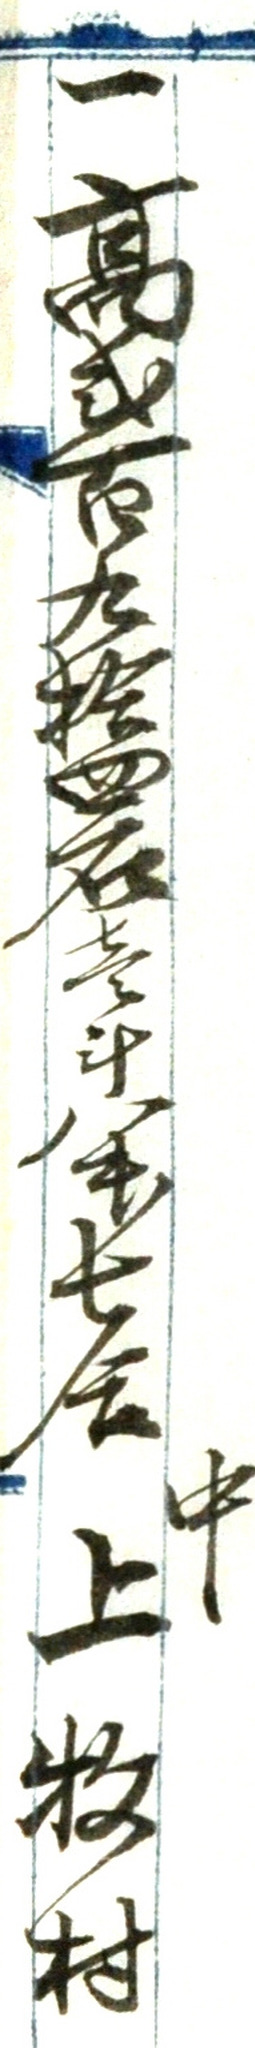一高弐百九拾四石壱斗八升七合上牧村
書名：御領分中村々高付帳
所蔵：伊那市立高遠町図書館・合同会社AMANE
